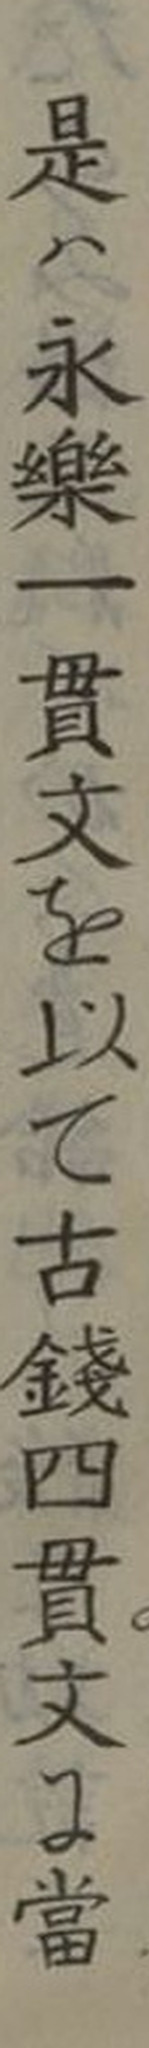是は永樂一貫文を以て古銭四貫文に當
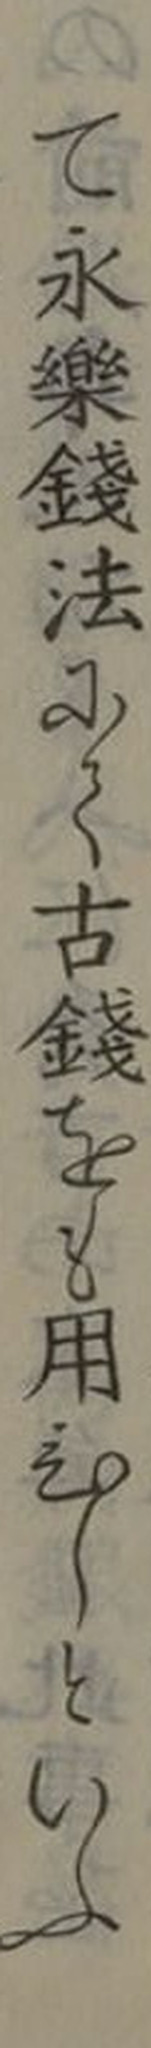て永樂錢法にて古銭をも用ひしといふ
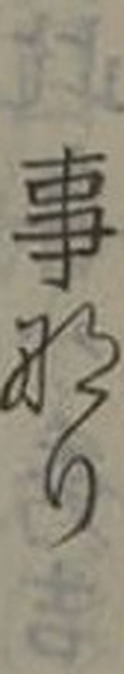事なり
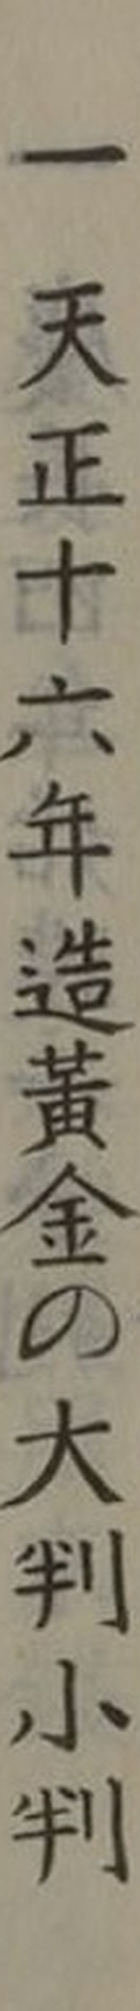一天正十六年造黄金の大判小判
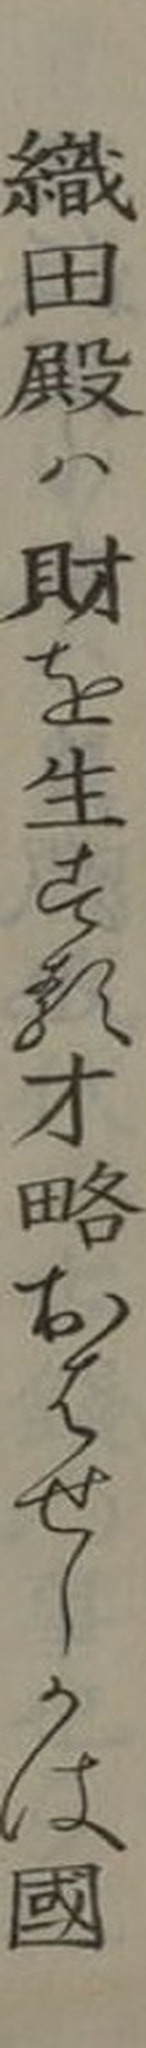織田殿は財を生する才略おはせしかは國
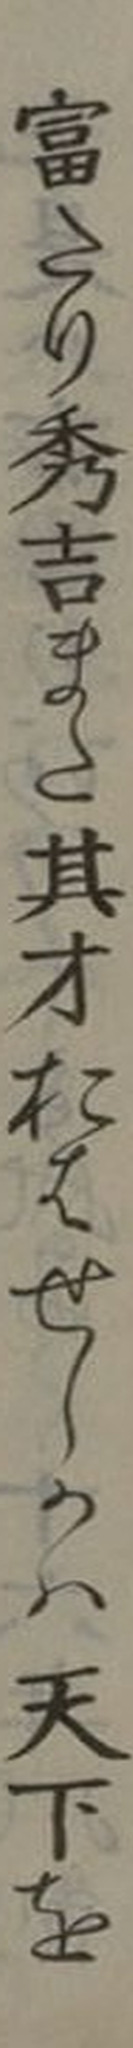富たり秀吉また其才おはせしかは天下を
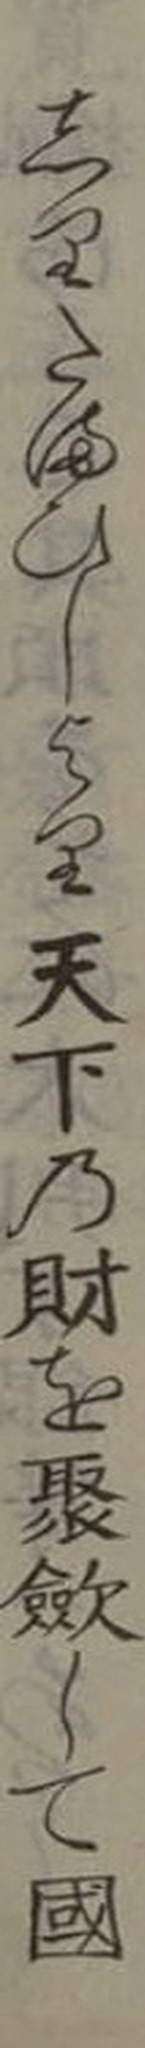しりたまひしより天下の財を聚斂して國
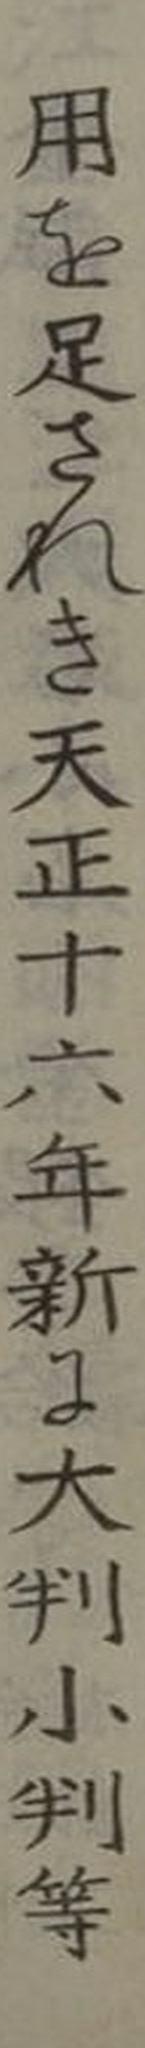用を足されき天正十六年新に大判小判等
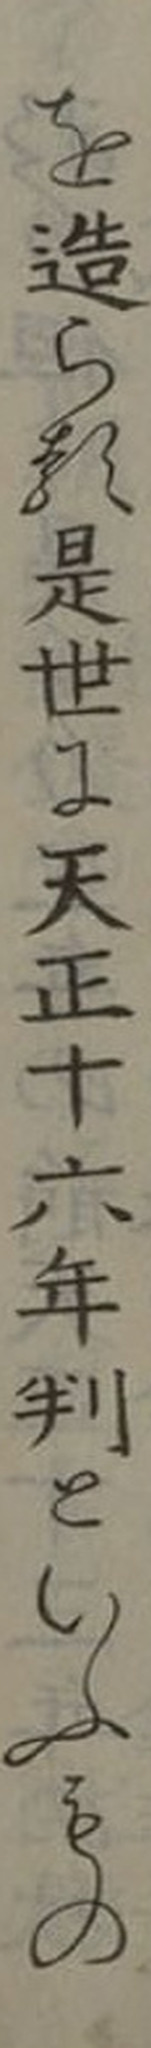を造らる是世に天正十六年判といふもの

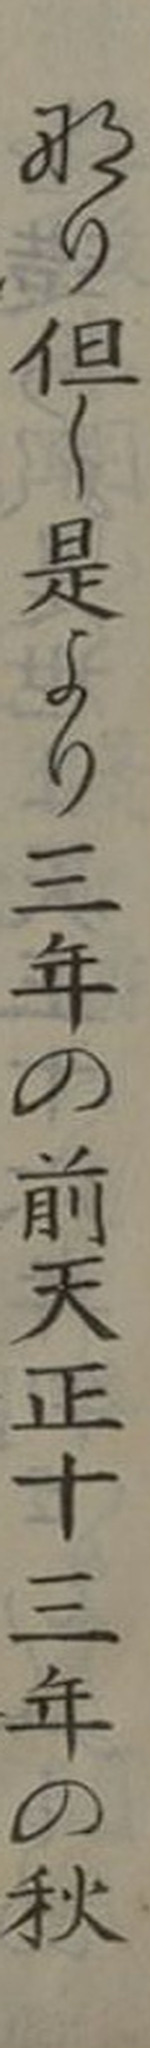なり但し是より三年の前天正十三年の秋
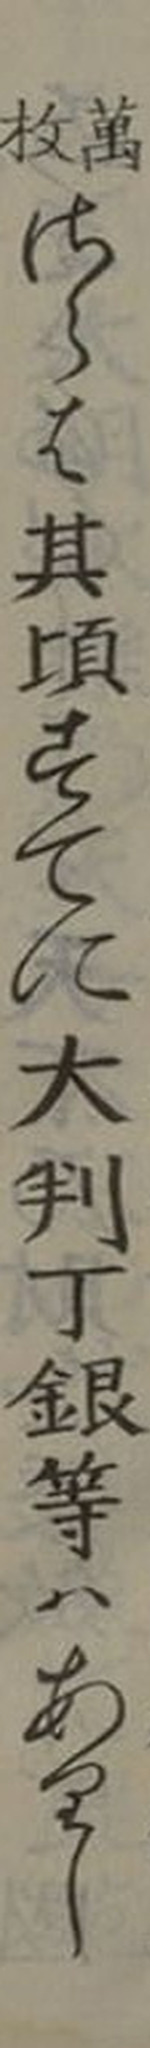萬枚さらは其頃すてに大判丁銀等はありし
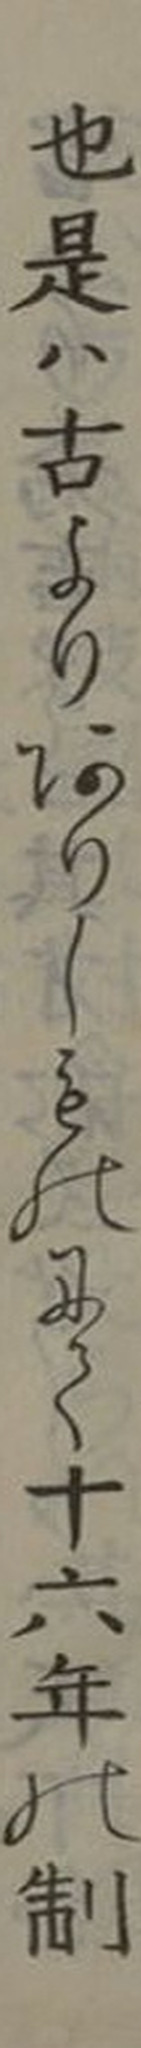也是は古よりありしものにて十六年の制
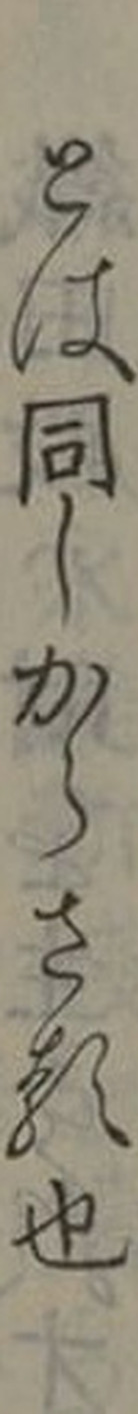とは同しからさる也
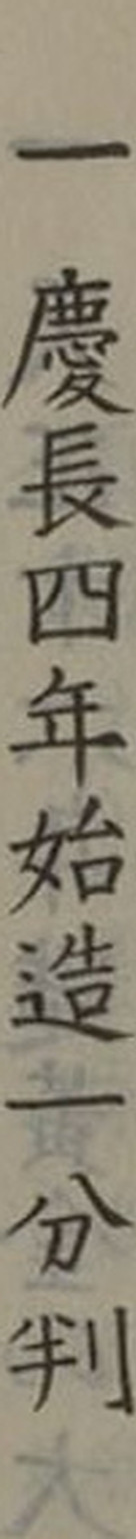一慶長四年始造一分判、
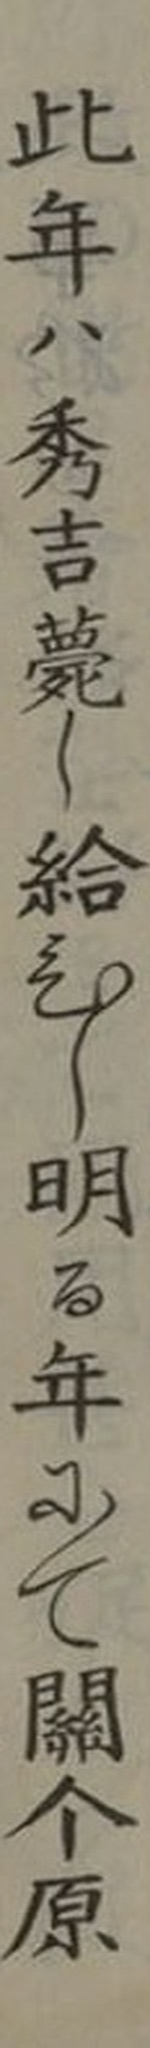此年は秀吉薨し給ひし明る年にて關个原
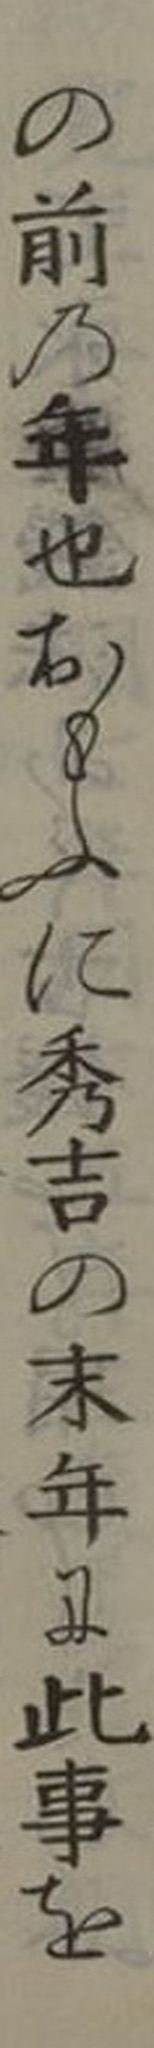の前の年也おもふに秀吉の末年に此事を
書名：骨董録
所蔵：University of the Ryukyus Library
